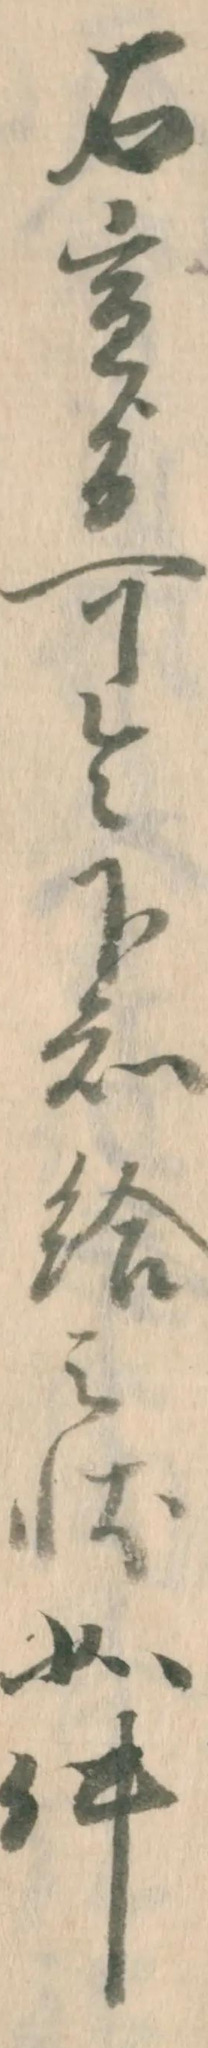右宣旨可令下知給之状如件
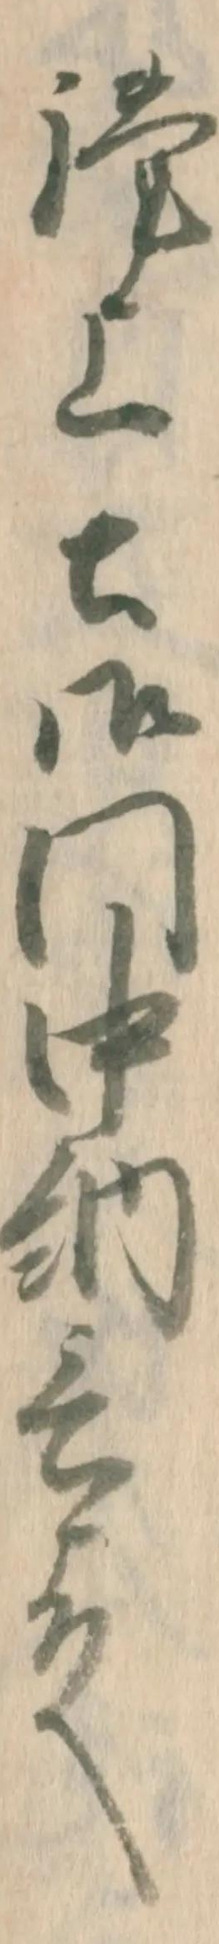謹上土御門中納言殿

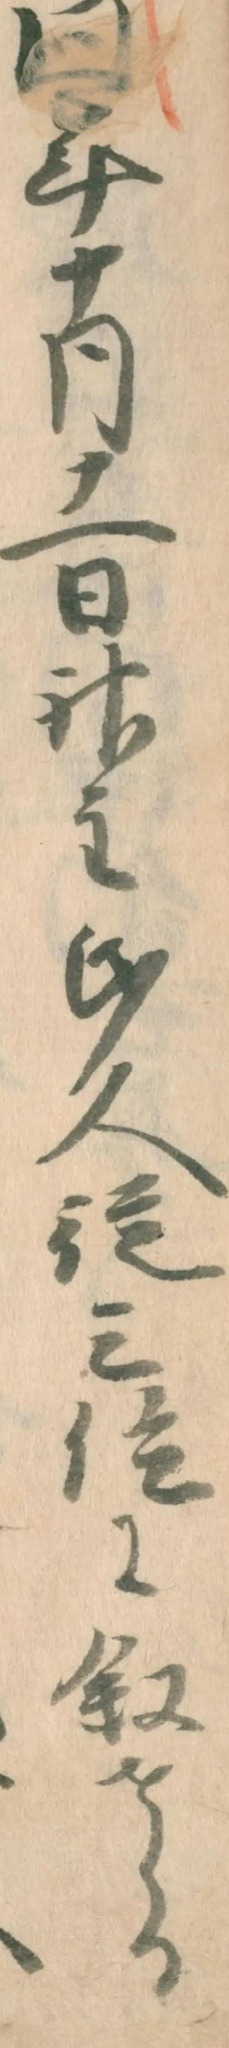同年十月十一日神主氏久従三位に叙せらる
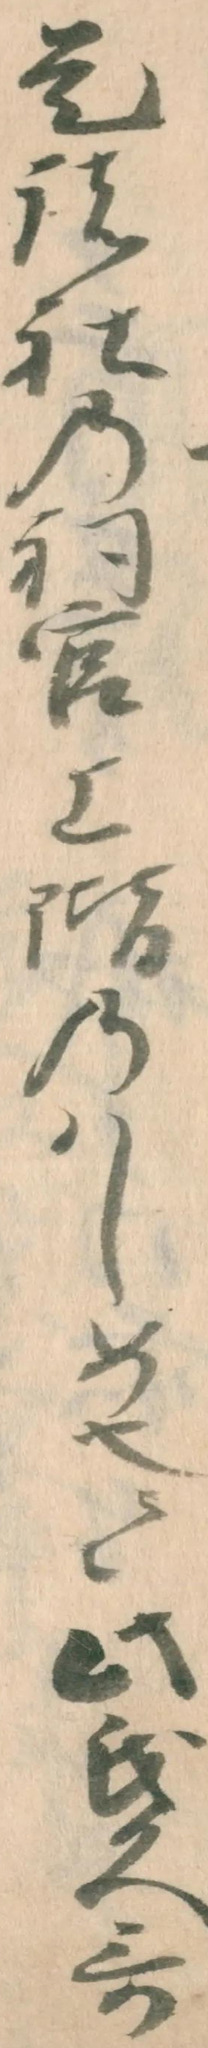是諸社の祠官上階のはしめ也云々此氏久哥
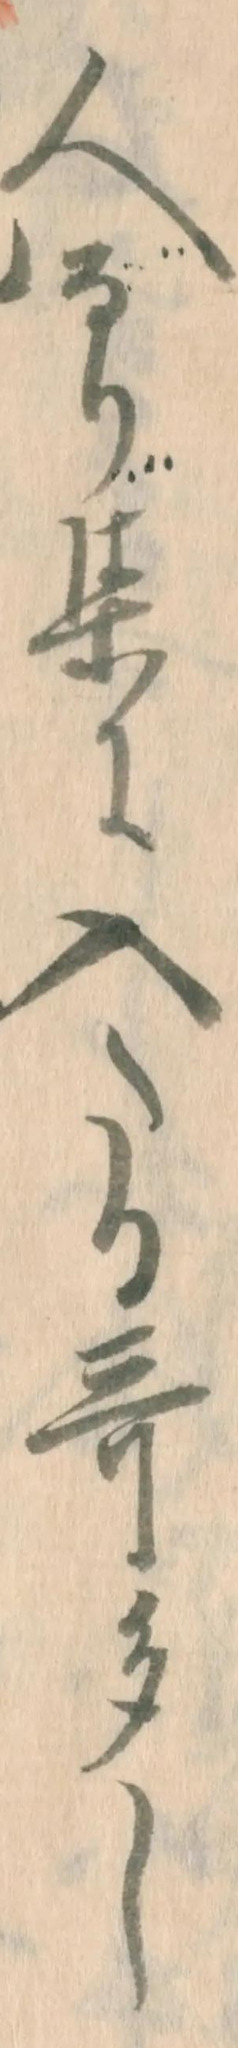人なり集に入たる哥多し
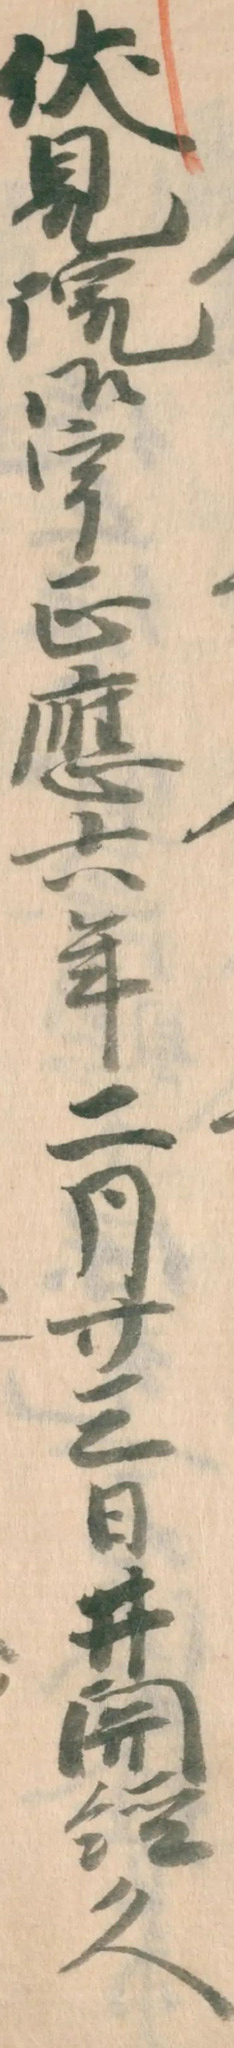伏見院御宇正応六年二月廿三日井関経久
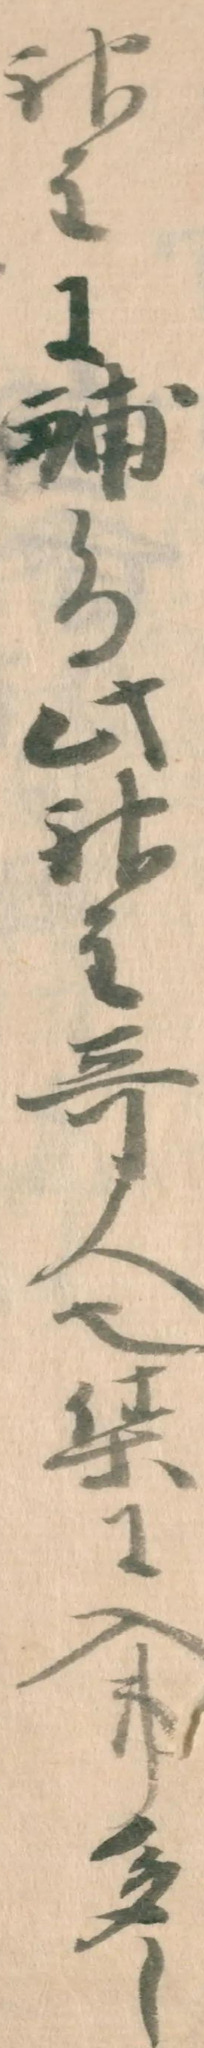神主に補らる此神主哥人也集に入事多し
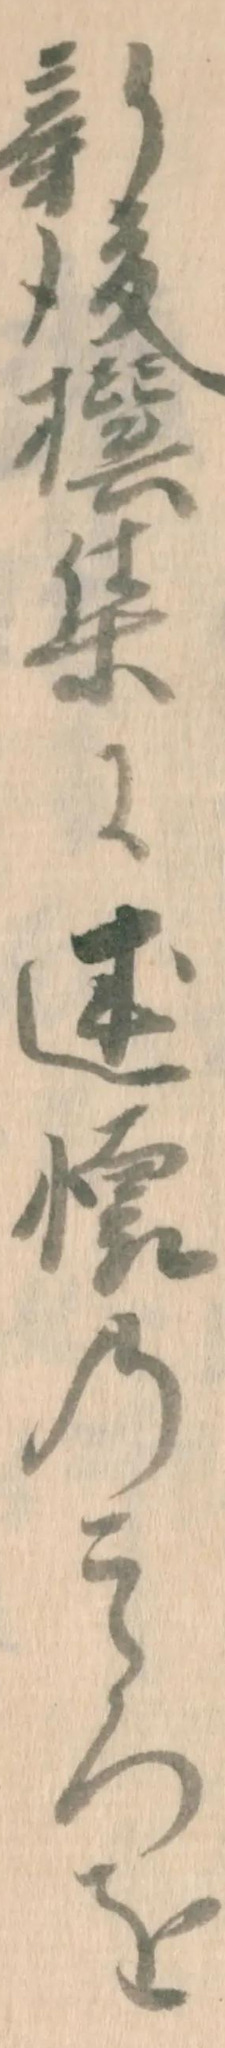新後撰集に述懐のこゝろを
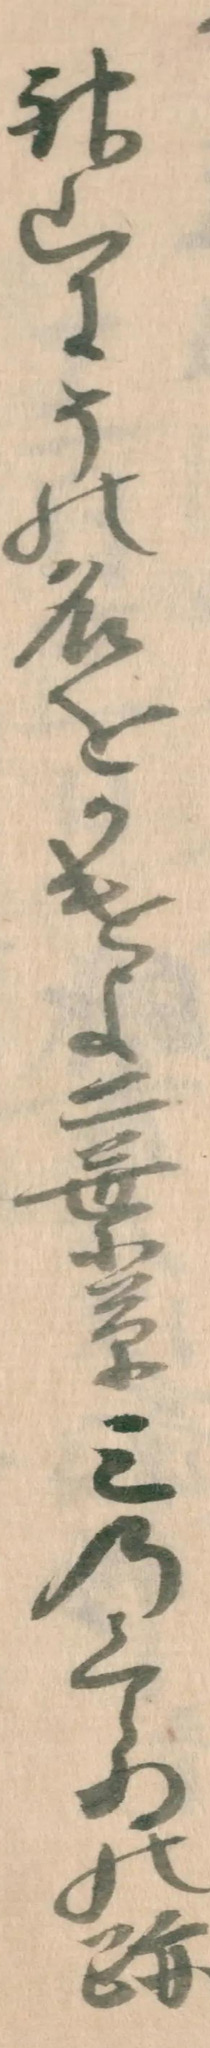神山にその名をかけよ二葉草三のくらゐの跡
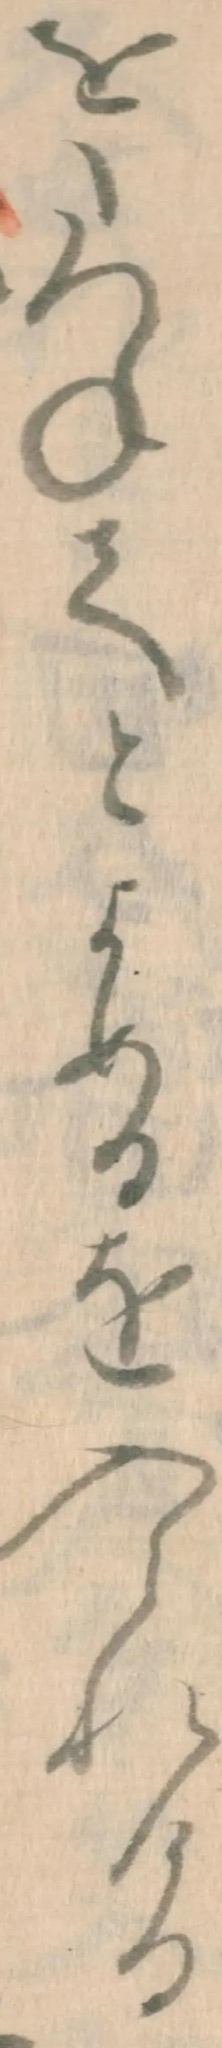をたつねてとよめるを入られける
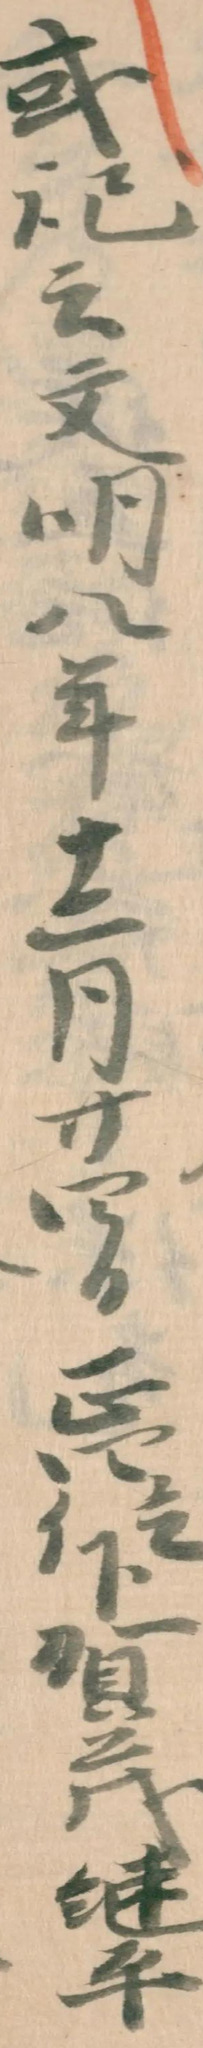或記云文明八年十二月廿四日正四位下賀茂継平
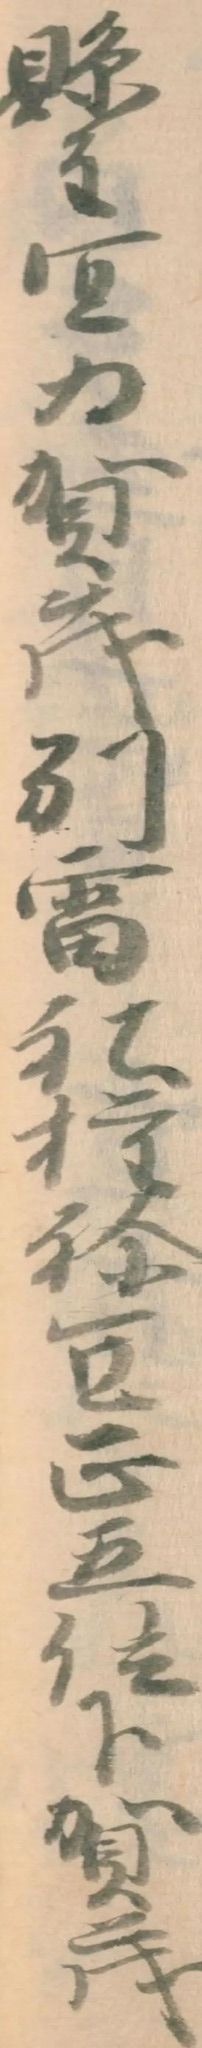県主宜為賀茂別雷社権祢宜正五位下賀茂
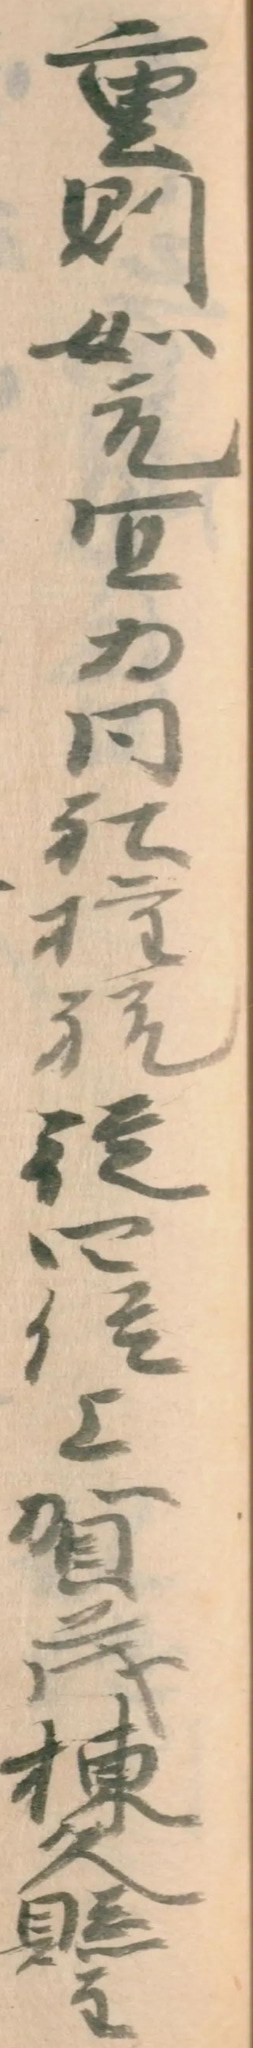重則如元宜為同社権祝従四位上賀茂棟久県主
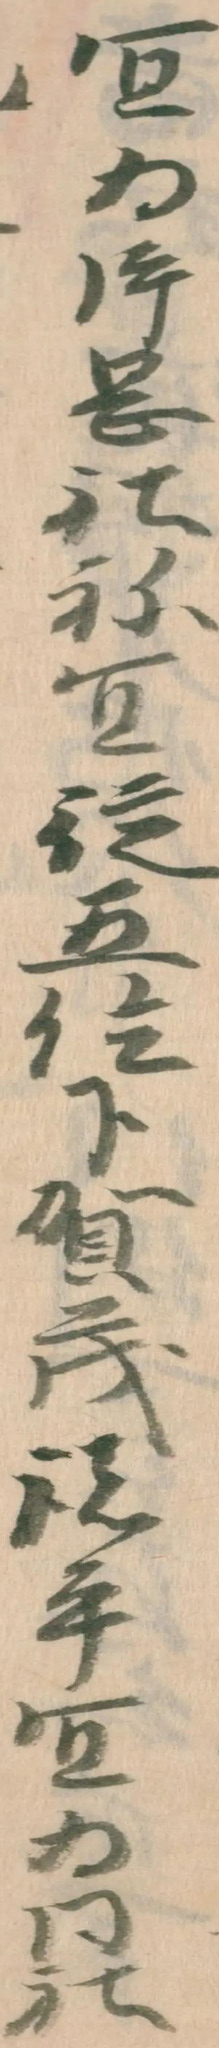宜為片岡社祢宜従五位下賀茂諸平宜為同社
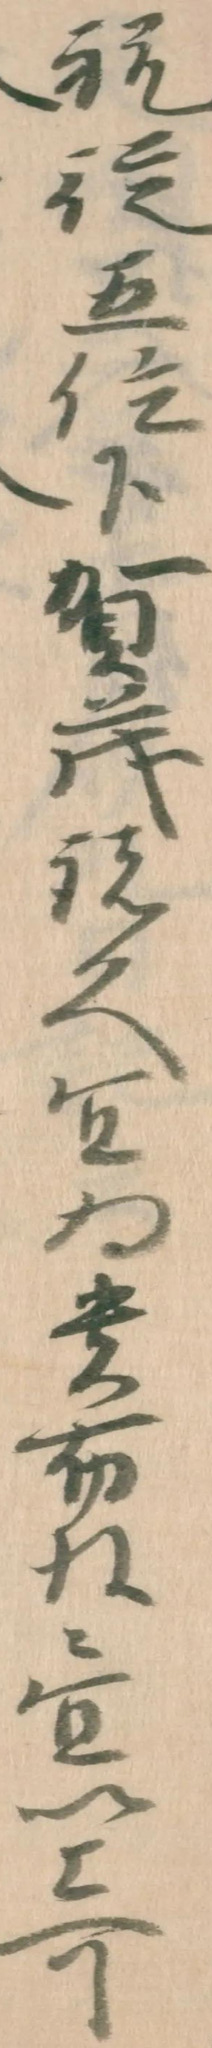祝従五位下賀茂諸久宜為貴ふねゝ宜以上可
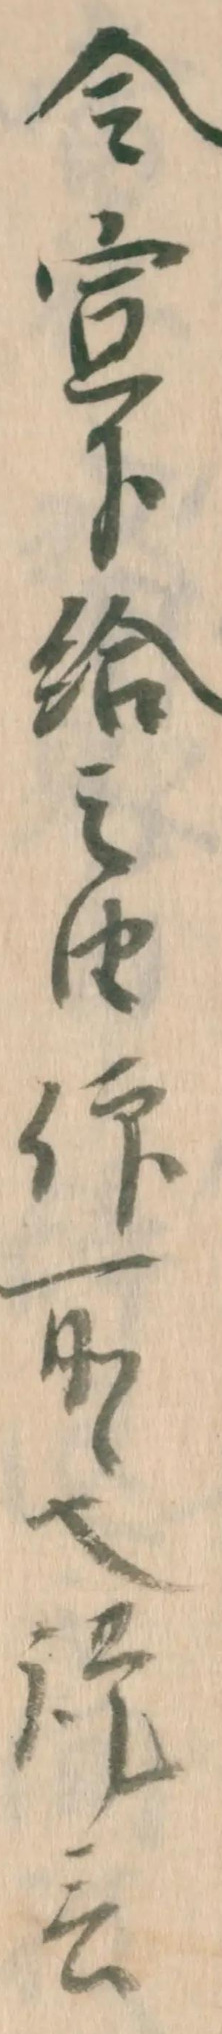令宣下給之由仰所候也謹言
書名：賀茂社記録. 第1冊
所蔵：国立国会図書館 National Diet Library, JAPAN
